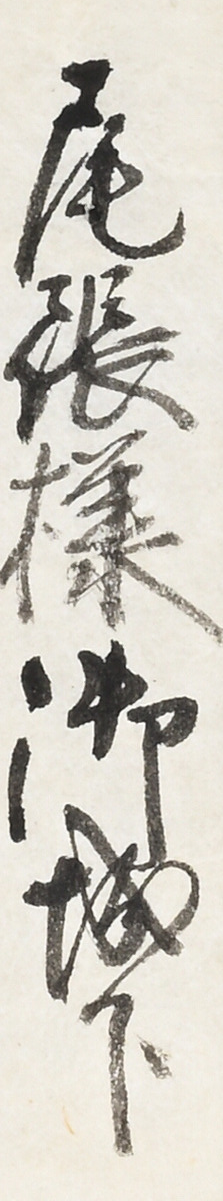尾張様御城下
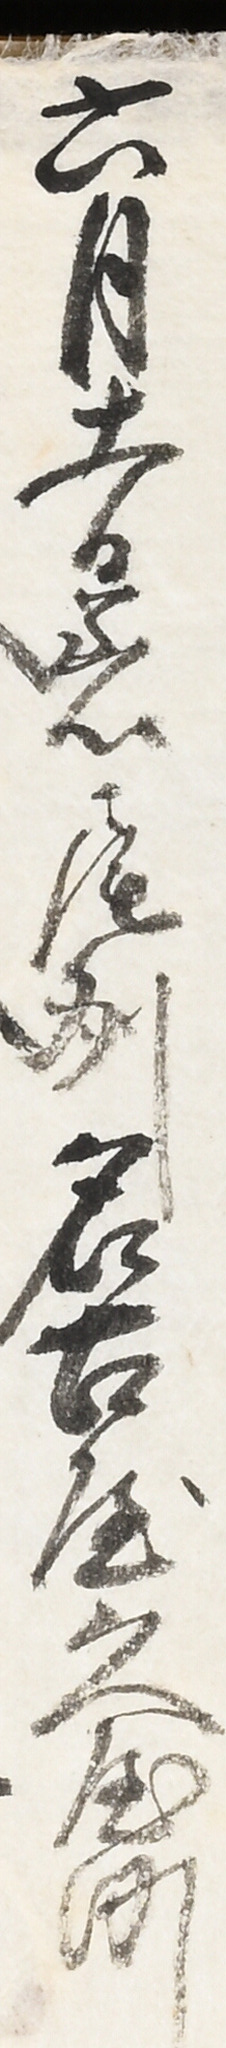六月十一日着尾州名古屋久屋町
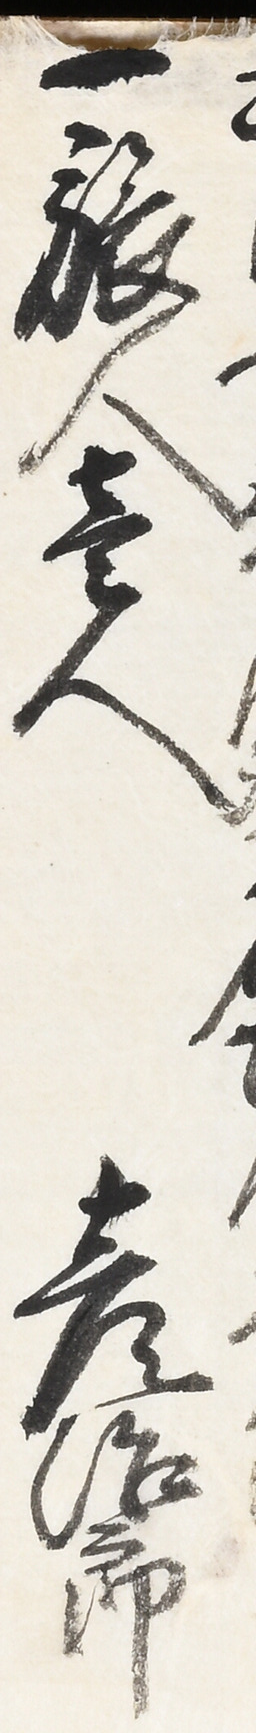一旅人壱人彦治郎
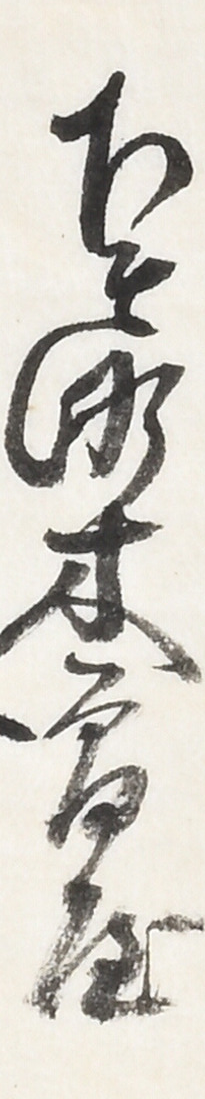下モ町木曽屋
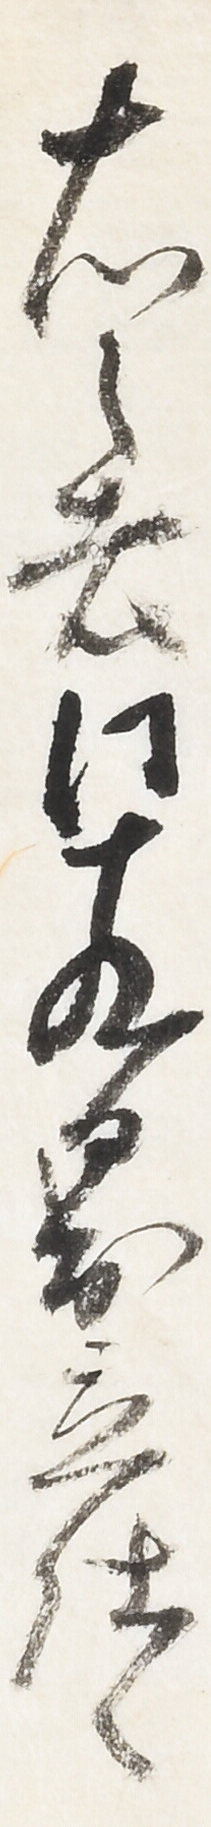右之者同十九日出立仕候
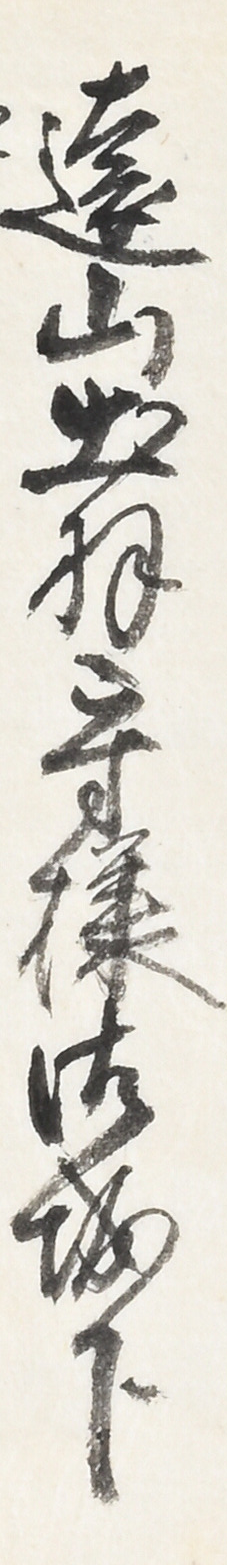遠山出羽守様御城下
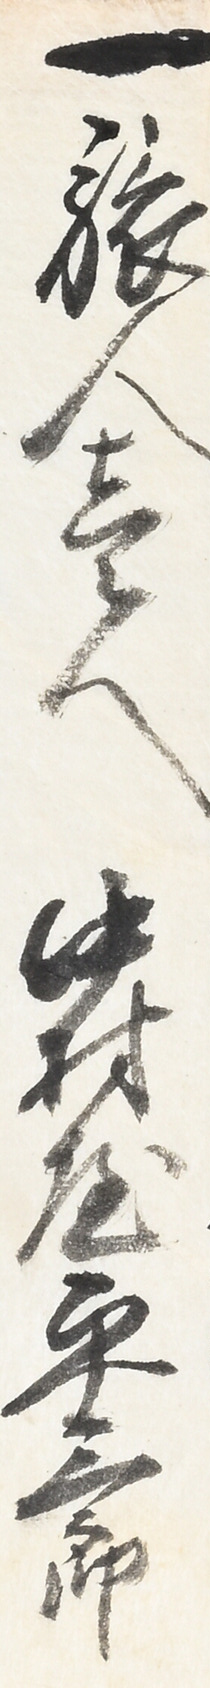一旅人壱人中村屋平三郎
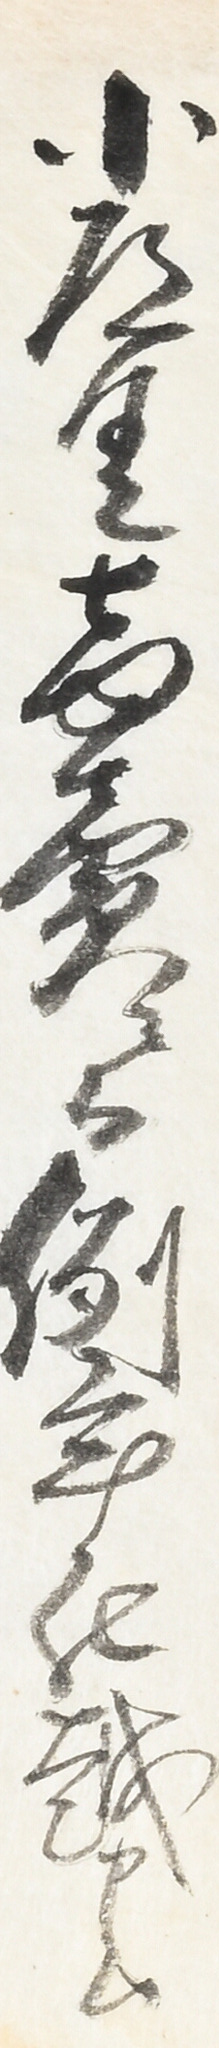小道具商売ニ而例年罷越申候
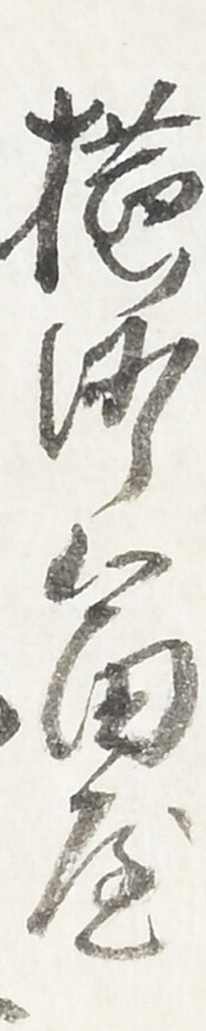横町冨屋
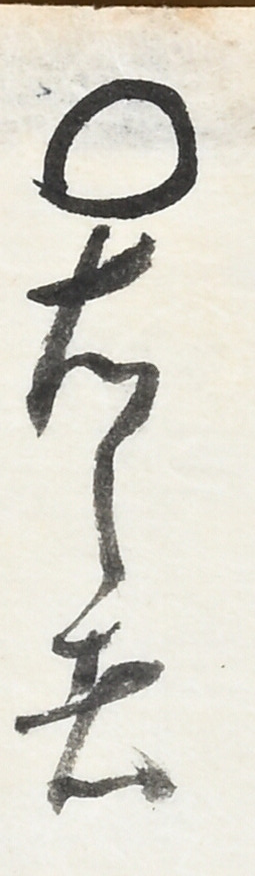〇右之者

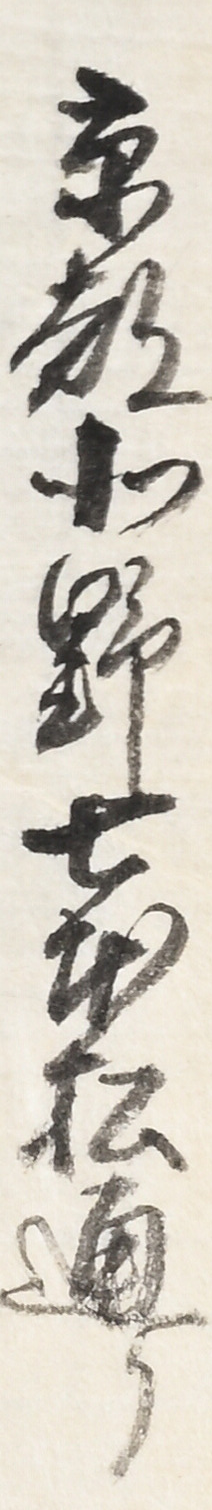京都北野七本松通リ
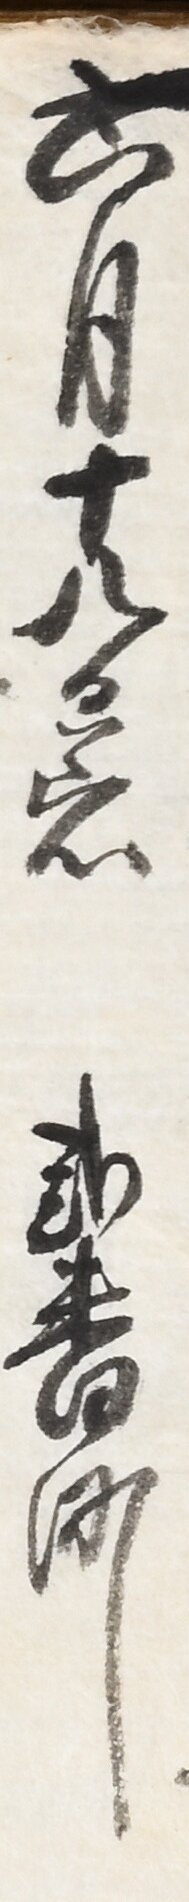六月十八日着弐番町
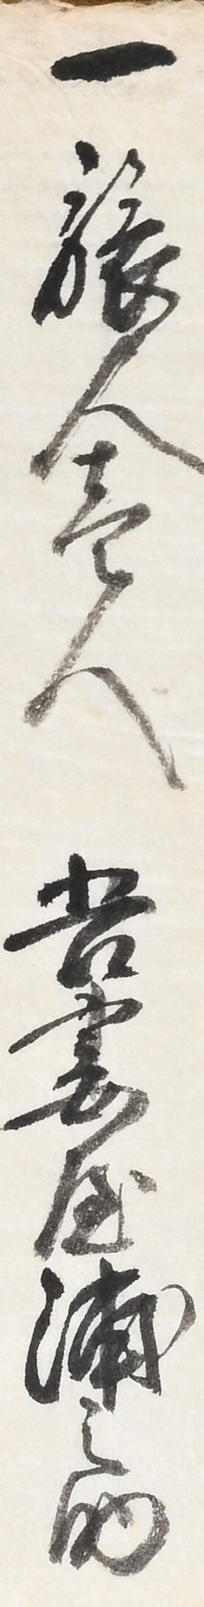一旅人壱人吾妻屋浦之助
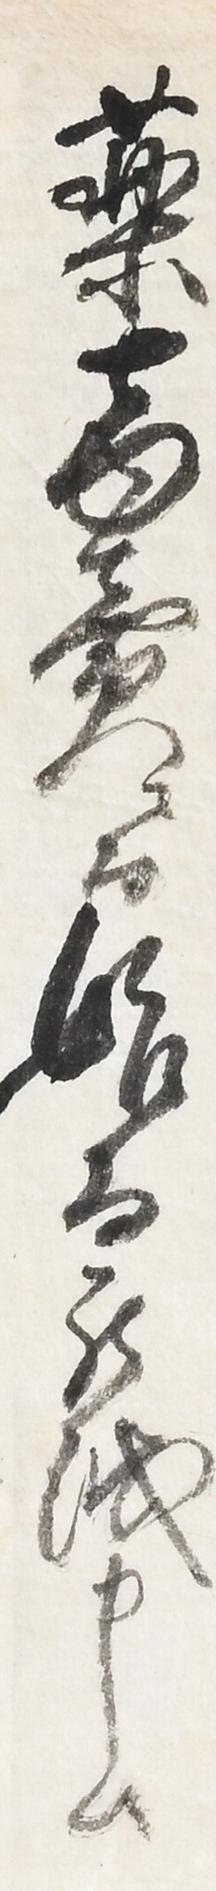薬商売ニ而始而罷越申候
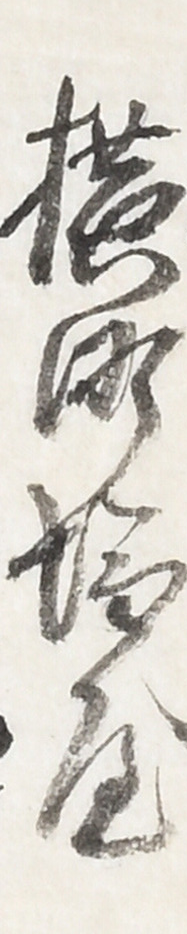横町塩屋
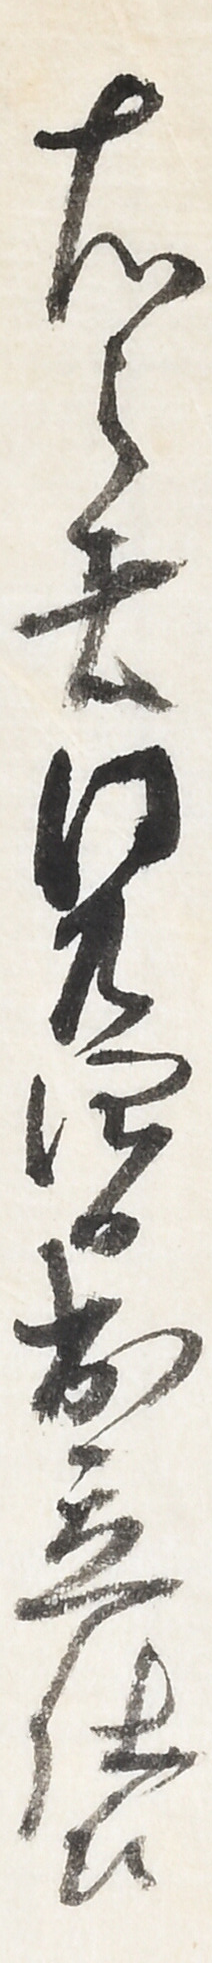右之者同廿四日出立仕候
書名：旅人泊控帳
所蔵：伊那市立高遠町図書館・合同会社AMANE
